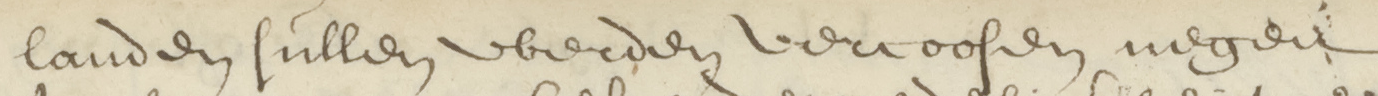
landen sullen werden vercoosen negen
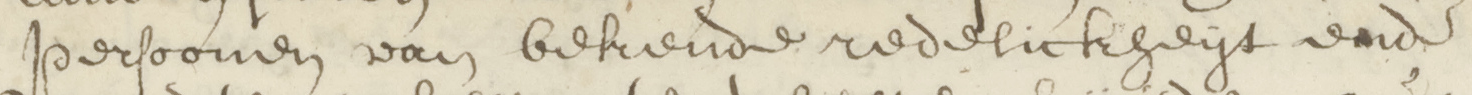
persoonen van bekende redelickheijt ende
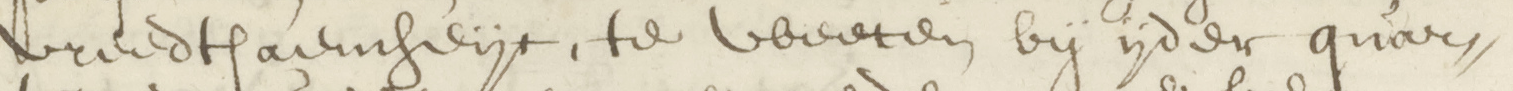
vreedtsaemheijt, te weeten bij ijder quar„
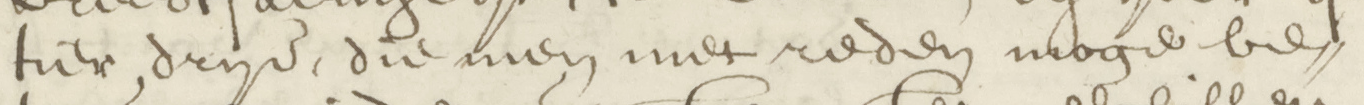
tier, drye, die men met reden moge be„
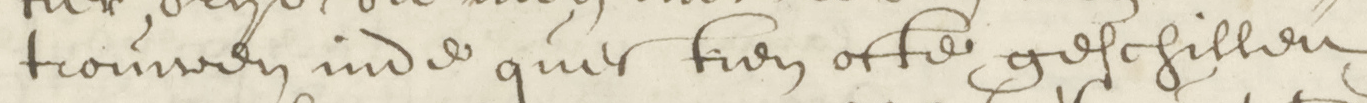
trouwen inde questien ofte geschillen
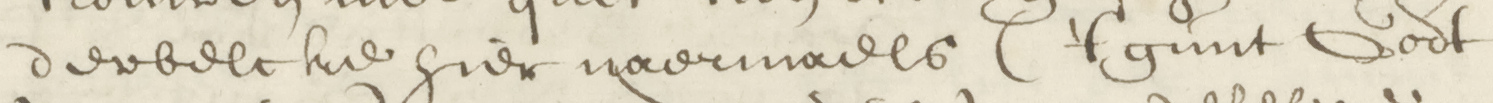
dewelcke hier naermaels ( ‛tgunt Godt
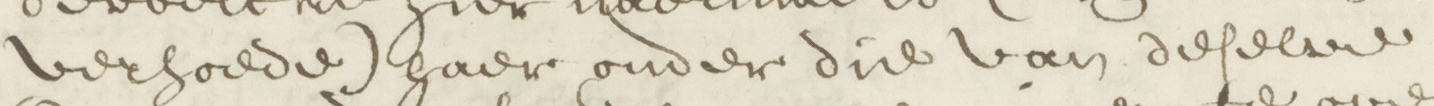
verhoede) haer onder die van deselve
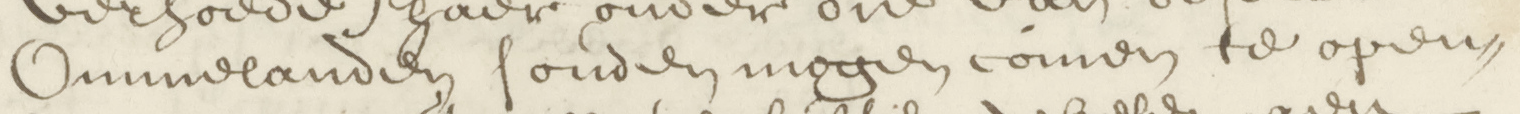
Ommelanden souden mogen comen te open„
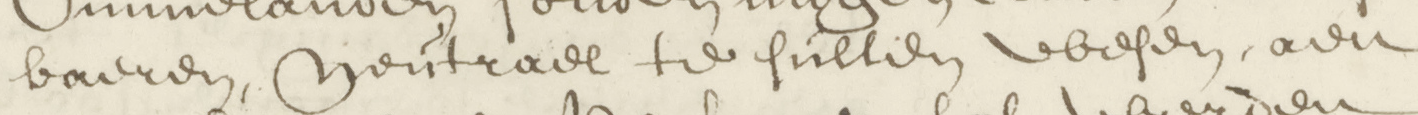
baeren, neutrael te sullen wesen, aen
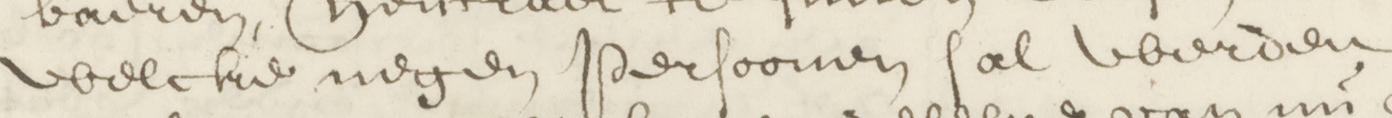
welcke negen Persoonen sal werden
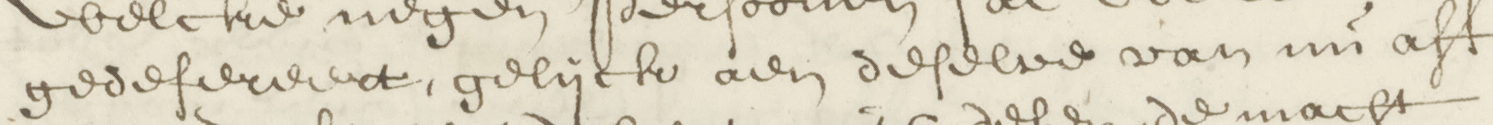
gedefereert, gelijck aen deselve van nu aff
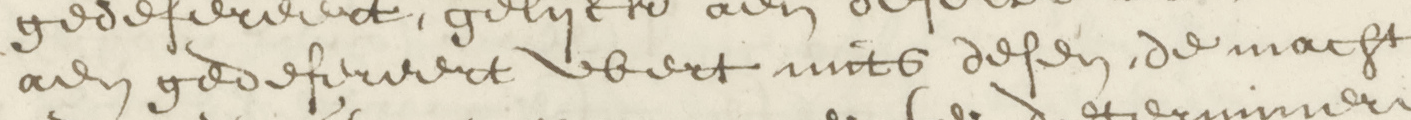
aen gedefereert wert mits desen, de macht
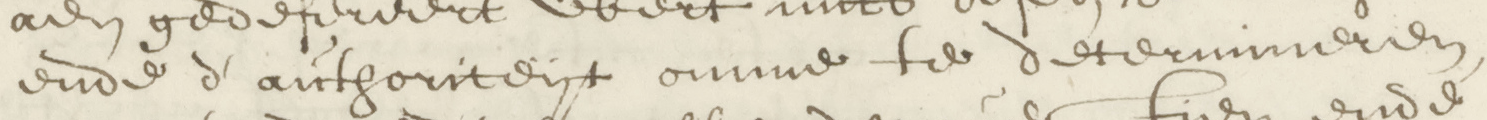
ende d‛authoriteijt omme te determineren,
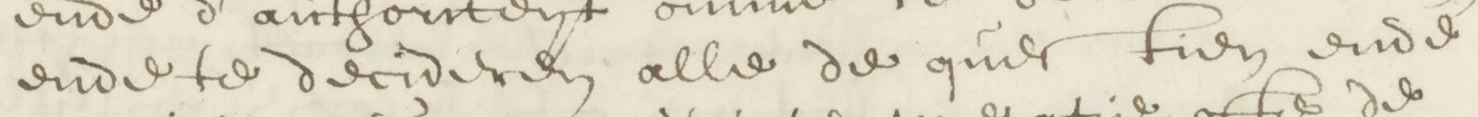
ende te decideren alle de questien ende
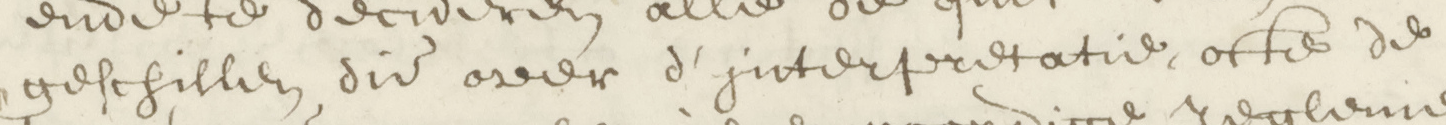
geschillen die over d‛interpretatie, ofte de
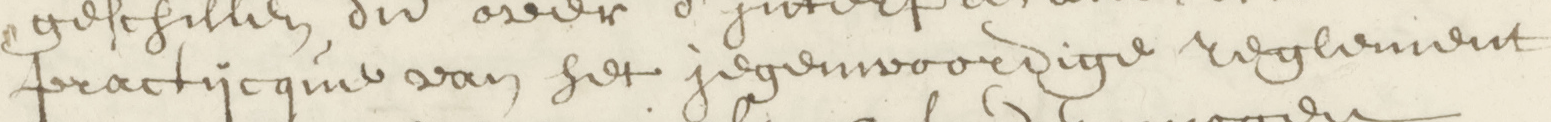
practijcque van het jegenwoordige reglement
